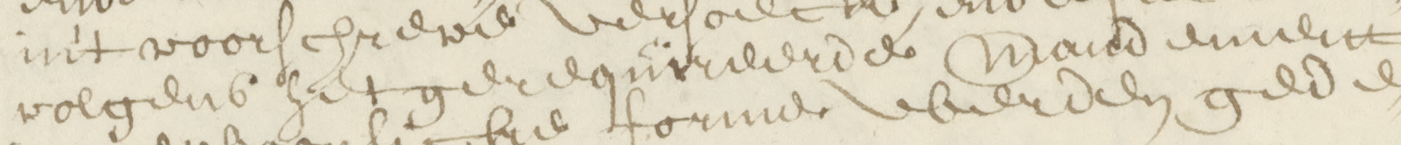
volgens het gerequireerde Mandement
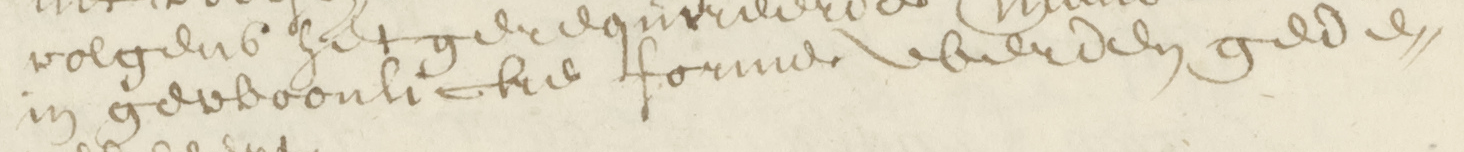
in gewoonlicke forme werden gede,,
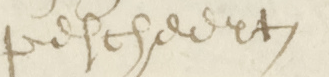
pescheert.
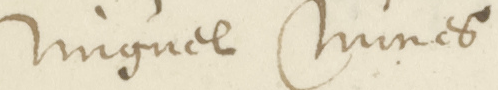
Miguel Nunes
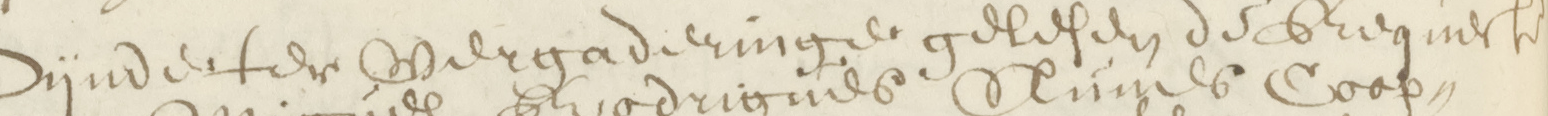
Sijnde ter Vergaderinge gelesen de Requeste
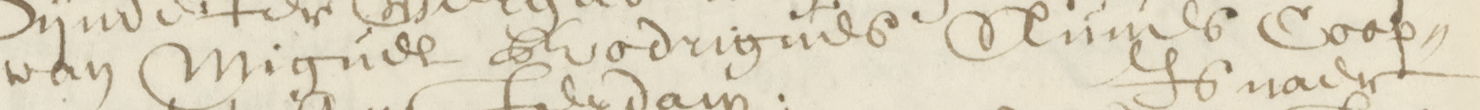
van Miguel Rodrigues Nunes Coop,,
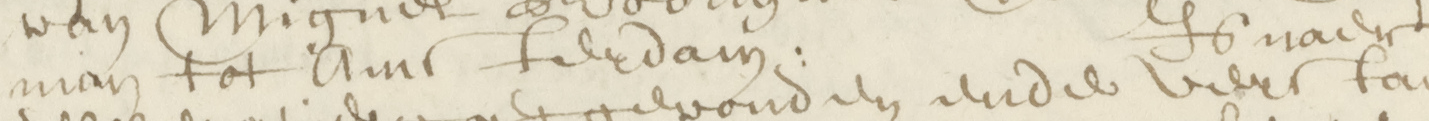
man tot Amsterdam: Is naer
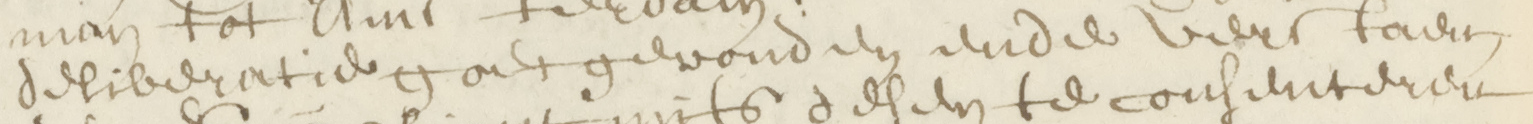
deliberatie goetgevonden ende verstaen
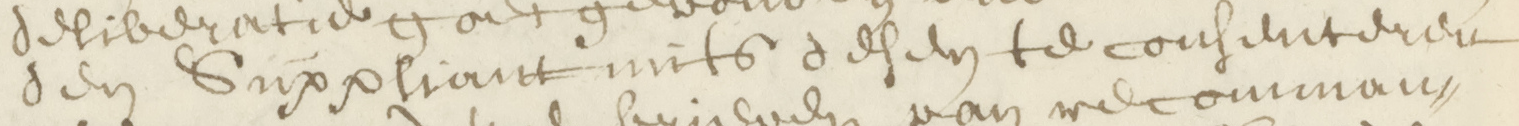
den Suppliant mits desen te consenteren
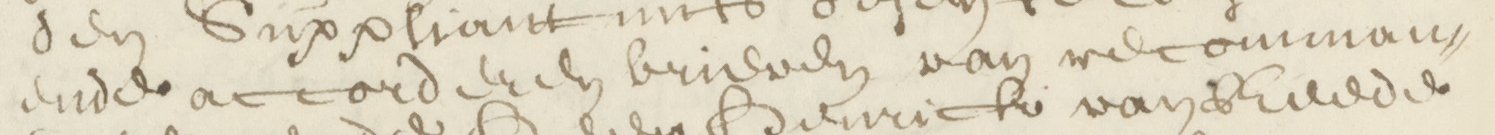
ende accorderen brieven van recomman,,
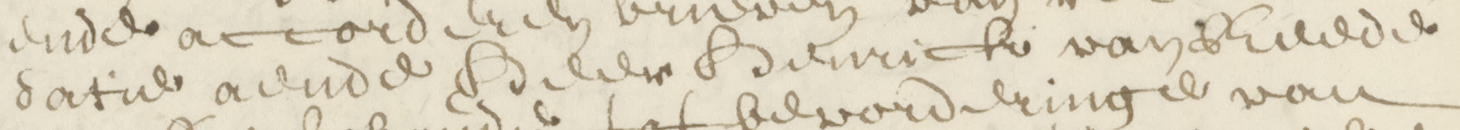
datie aende Heer Henrick van Reede
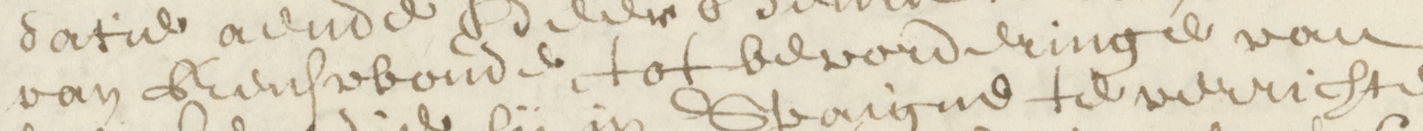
van Renswoude, tot bevorderinge van
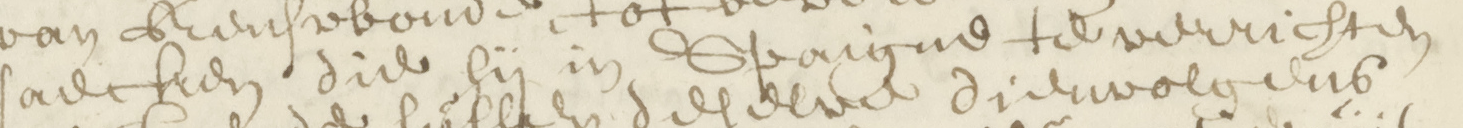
saecken die hij in Spaigne te verrichten
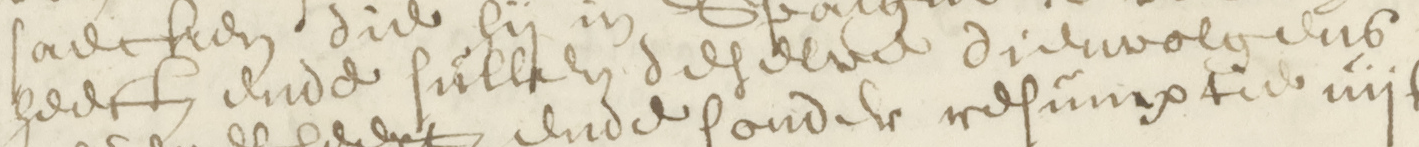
heeft, ende sullen deselve dienvolgens
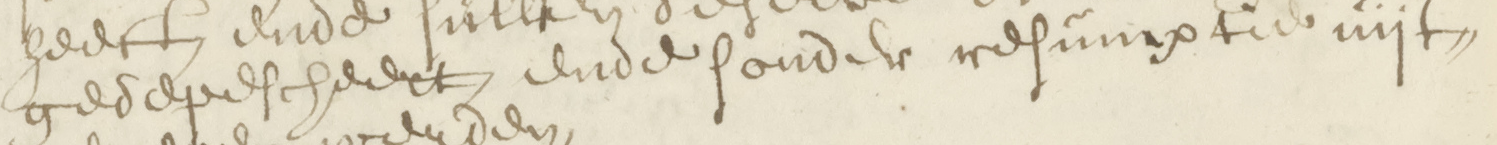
gedepescheert, ende sonder resumptie uijt,,
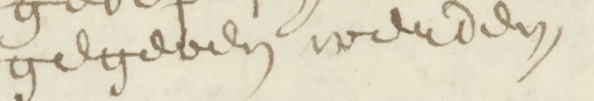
gegeven werden.
